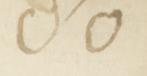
80
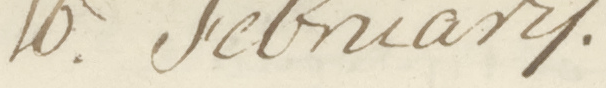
16 Februarij
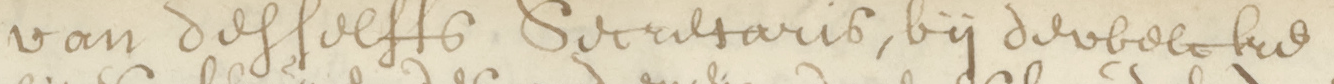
van desselffs Secretaris, bij dewelcke
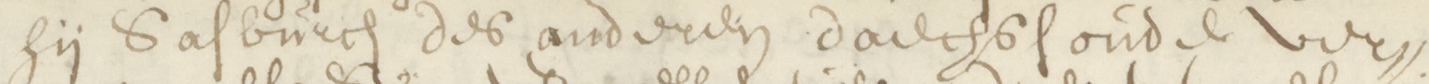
hij Sasburch des anderen daechs soude ver„
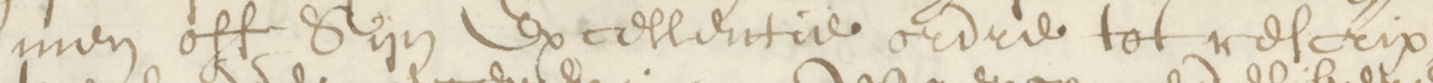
men off Sijn Excellentie ordre tot rescrip„
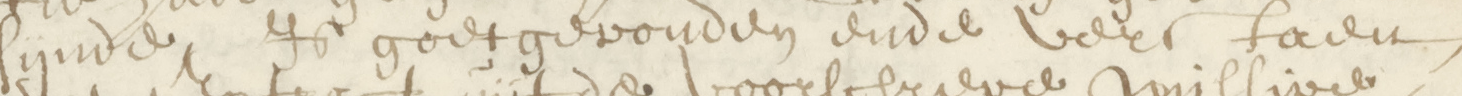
sijnde, Is goetgevonden ende verstaen
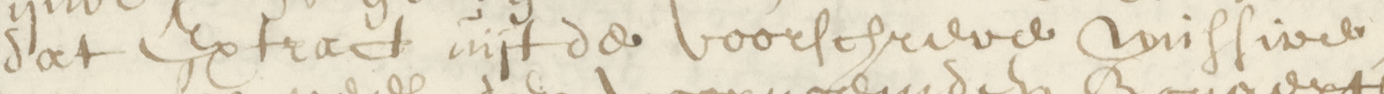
dat Extract uijt de voorschreve missive
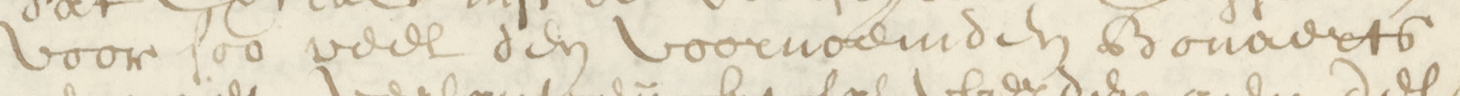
voor soo veel den voornoemden Bonaerts
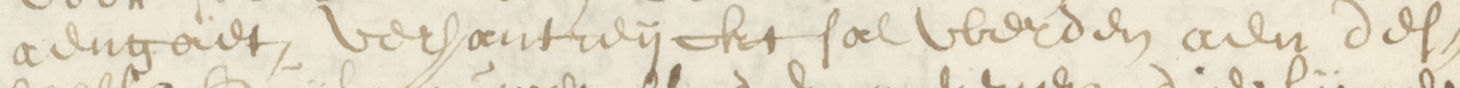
aengaet, verhantreijckt sal werden aen des„
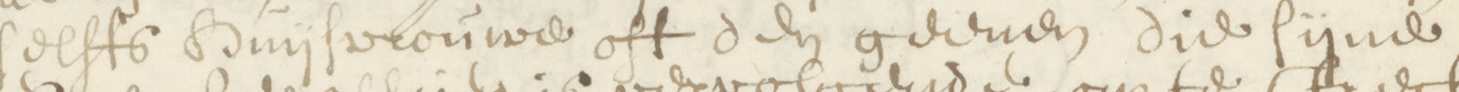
selffs Huijsvrouwe oft den geenen die sijne
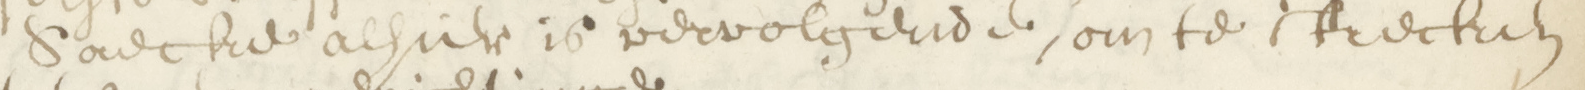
Saecke alhier is vervolgende, om te strecken
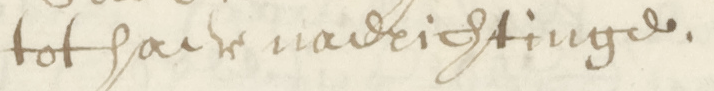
tot haere naerichtinge.
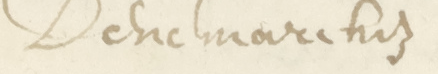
Denemarcken
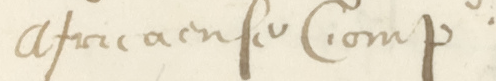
Africaense Compe.
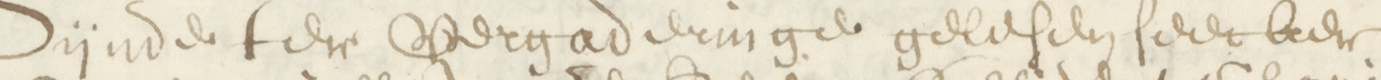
Sijnde ter Vergaderinge gelesen seecker
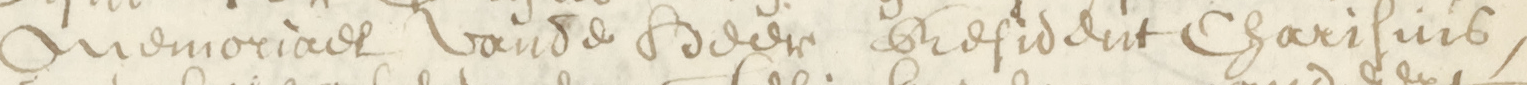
Memoriael vande Heer Resident Charisius,
